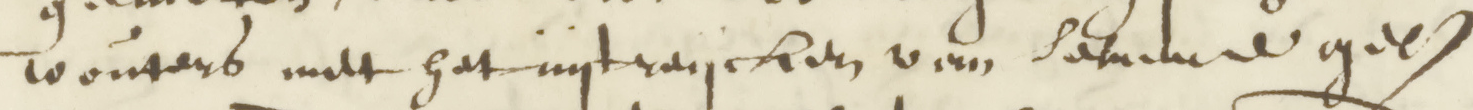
„wouters met het uijtreijcken van sekere gel
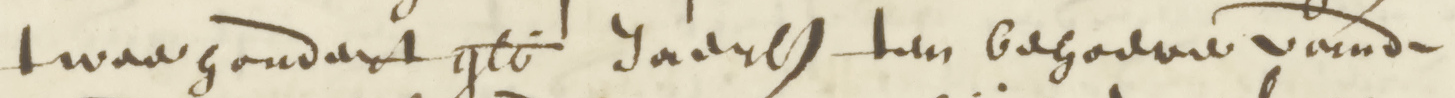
twee hondert gls Jaerl ten behoeve vande
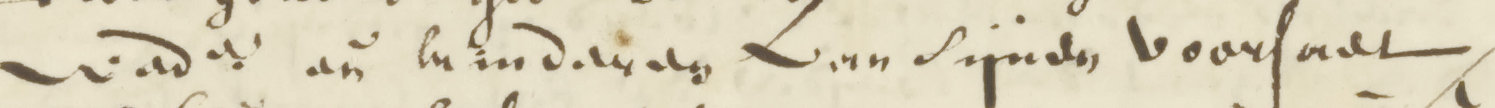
Wede. en kinderen van sijnen voorsaet
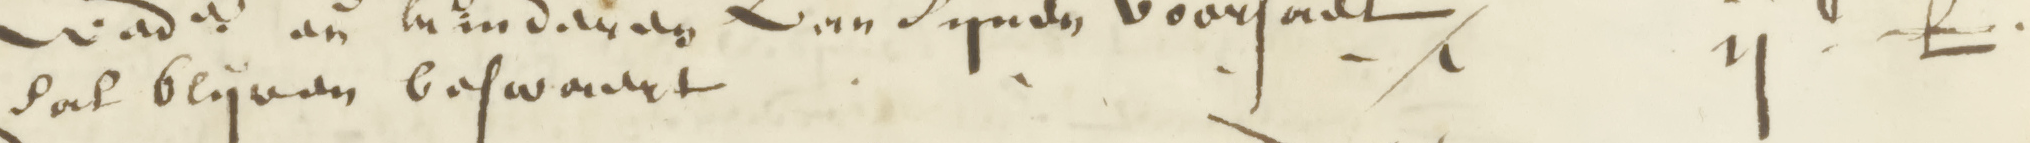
sal blijven beswaert . . . . ⁁ ijc. L
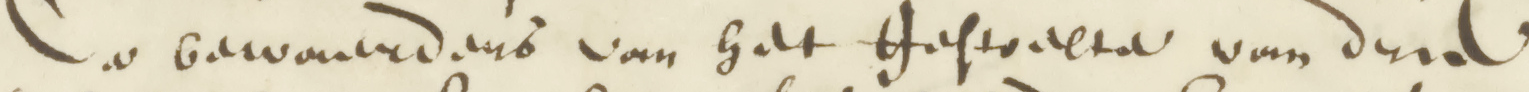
De bewaerders van het gestoelte van drie
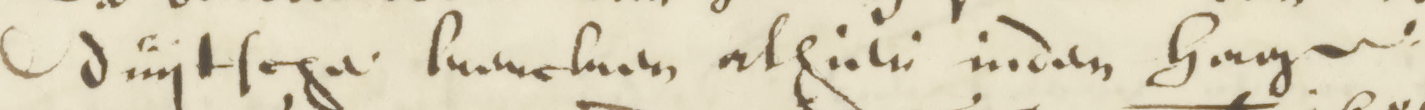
duijtsche kercken alhier inden hage
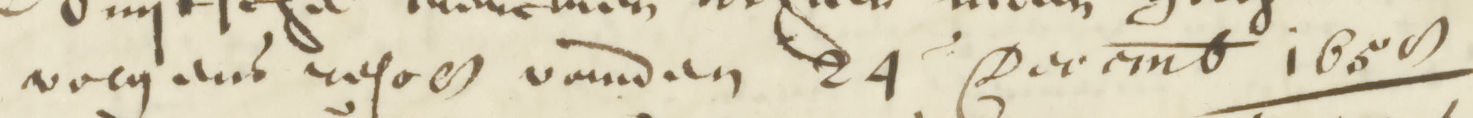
volgens resol vanden 24e. Decemb 1658
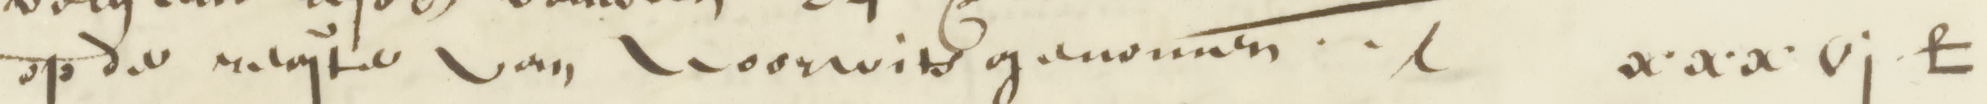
op de reqte van Noorwits genomen . . ⁁ xxxvj L
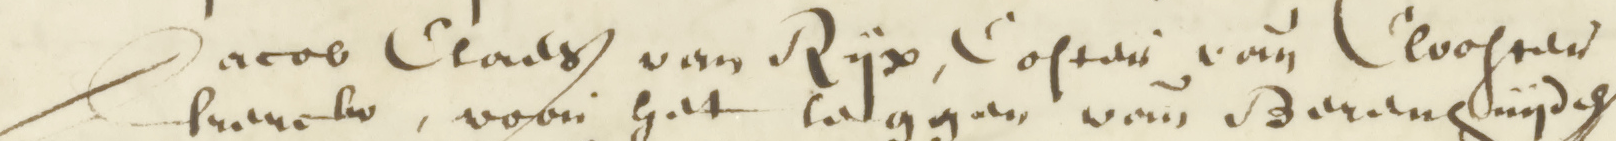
Jacob Claes van Rijp, Coster van Clooster
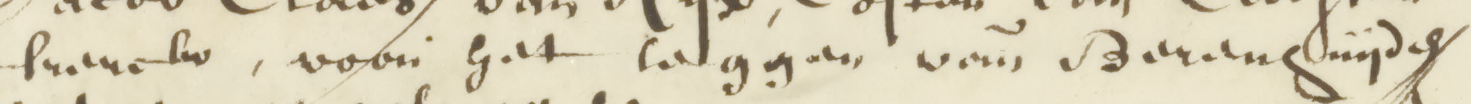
kerck, voor het leggen van Berenhuijden
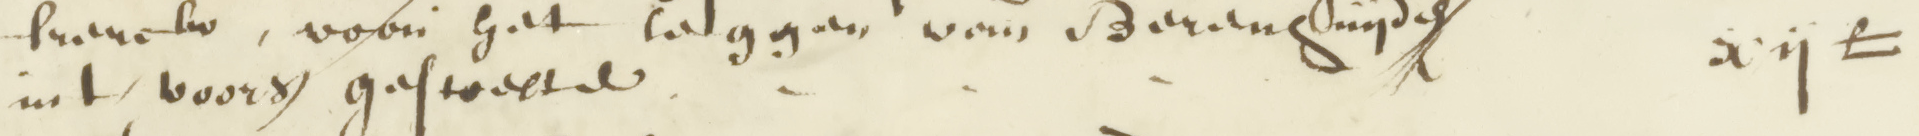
int' voors gestoelte . . . . ⁁ xij L
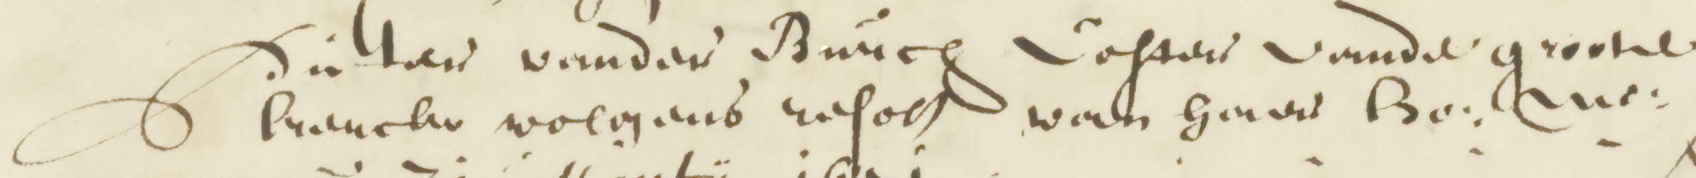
Pieter vander Burch Coster vande groote
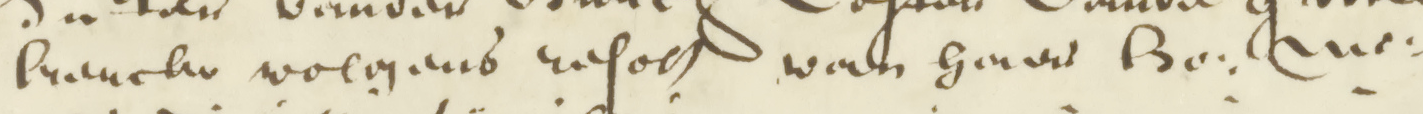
kerck volgens resol van haer Ho:Mo:
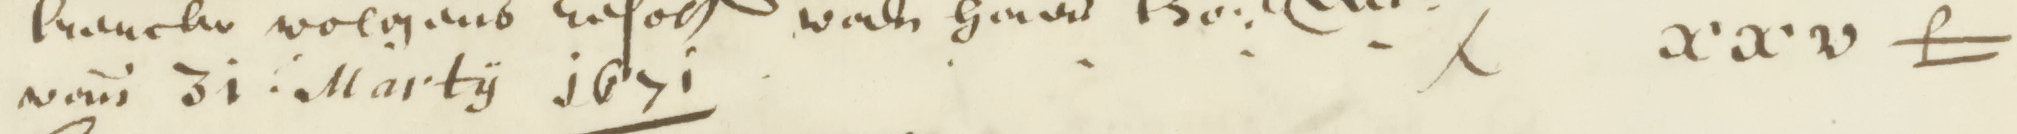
van 31: Martij 1671 . . . . . ⁁ xxv L
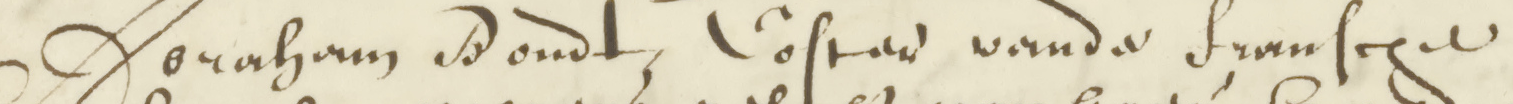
Abraham Bondt, Coster vande Fransche
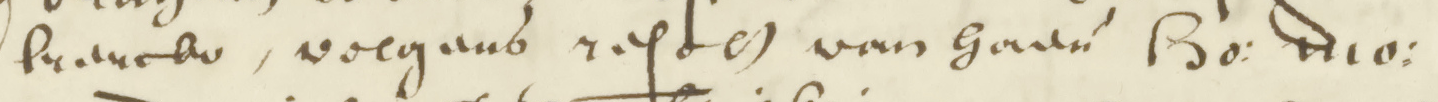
kerck, volgens resol van haer Ho:Mo:
